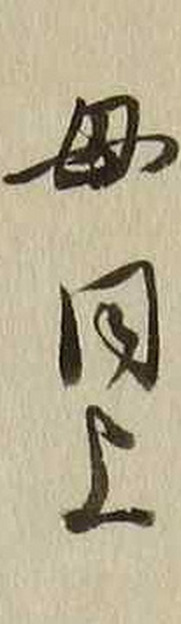母同上
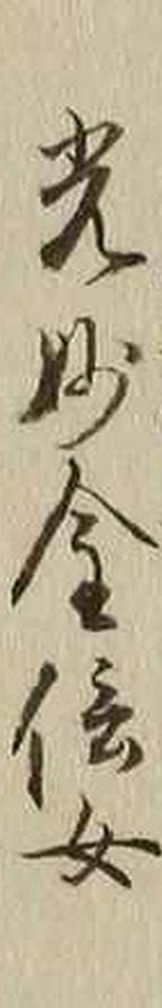光妙金信女
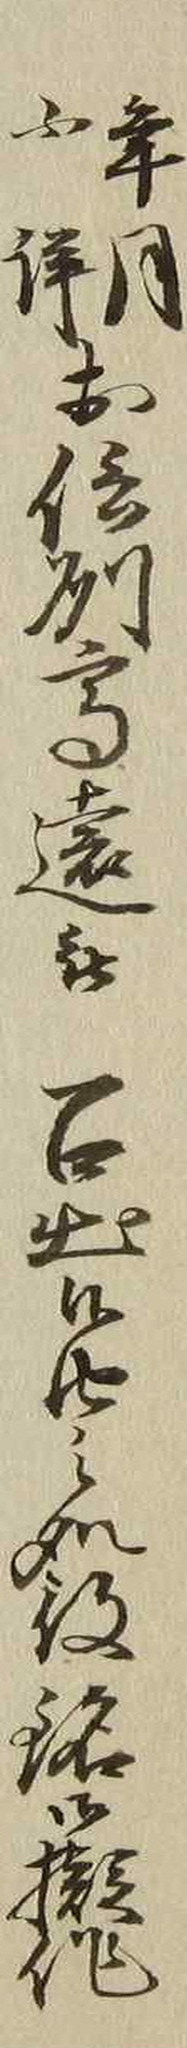一年月ふ詳お信州高遠被召出候由之処役銘御擬作
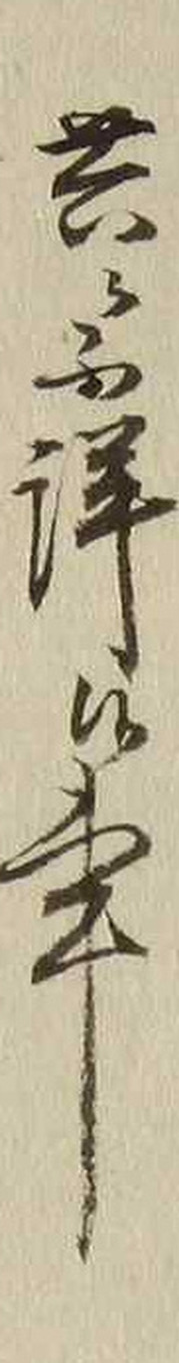共二ふ詳候事
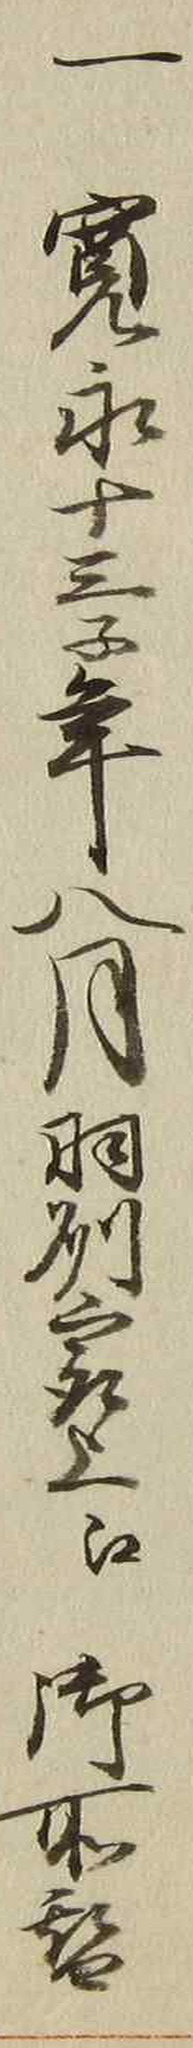一寛永十三子年八月羽州最上江御取替
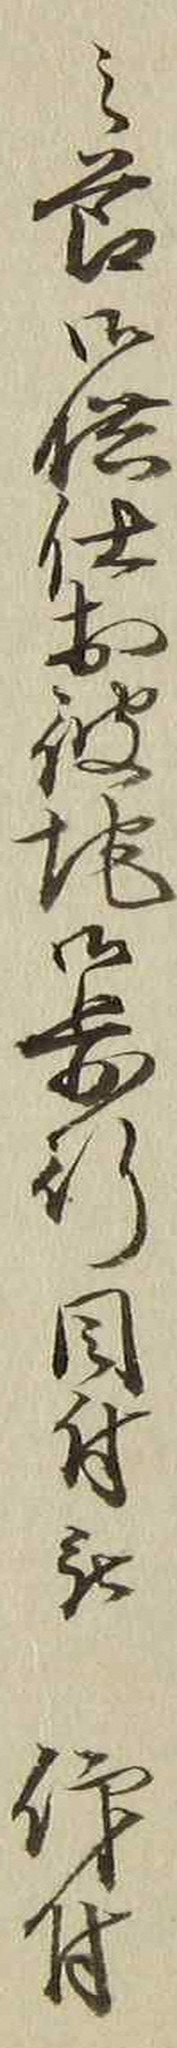之節御供仕お彼地御歩行目付被仰付
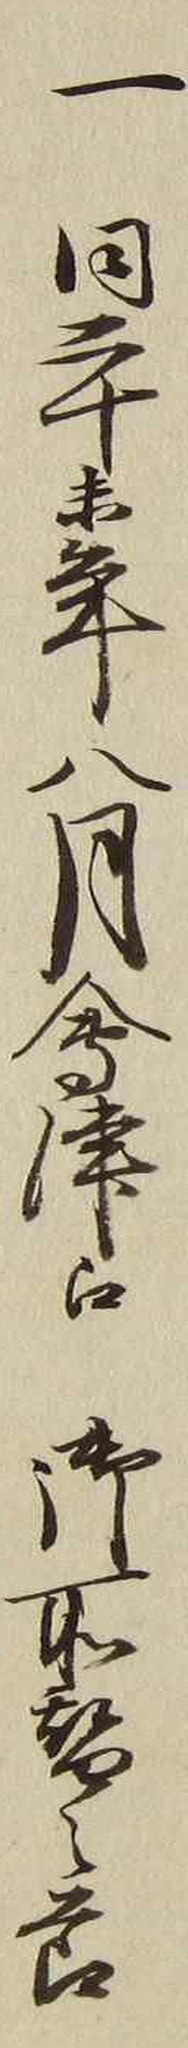一同二十未年八月会津江御取替之節
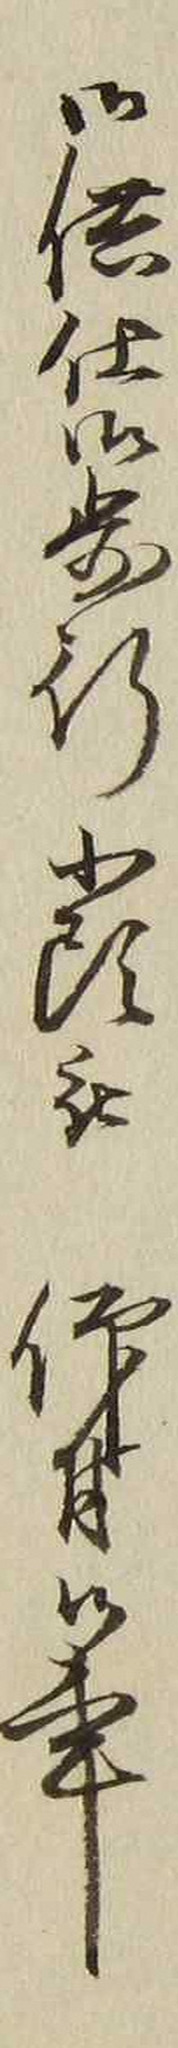御供仕御歩行小頭被仰付候事
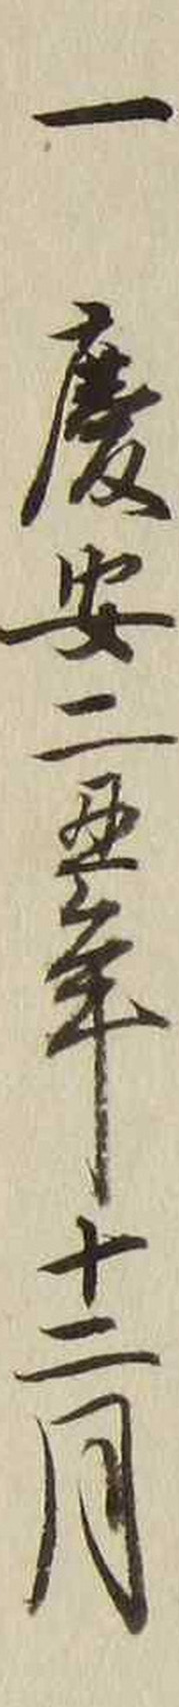一慶安ニ丑年十二月
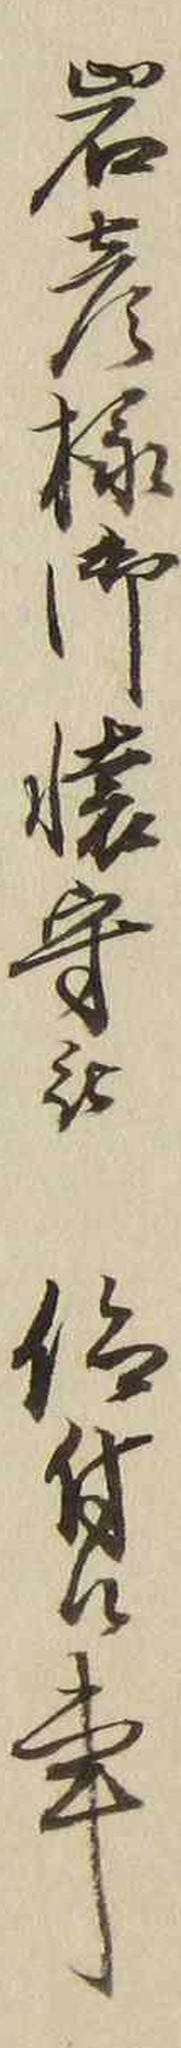岩彦様御懐守被仰付候事

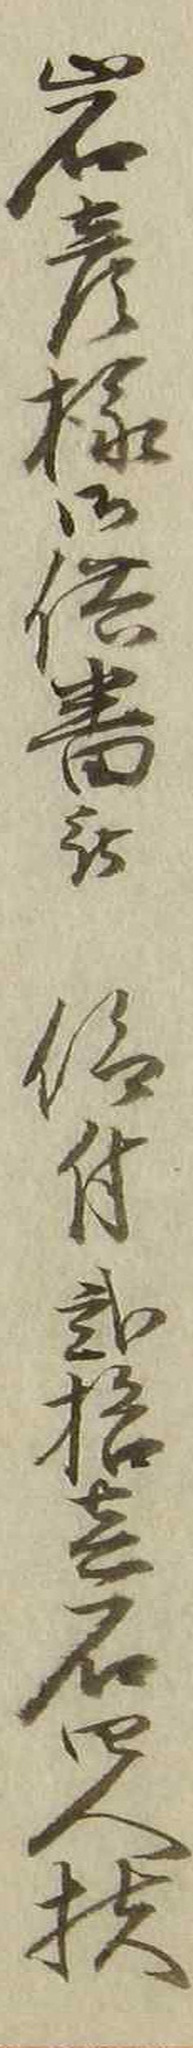岩彦様御供番被仰付弐拾壱石四人扶
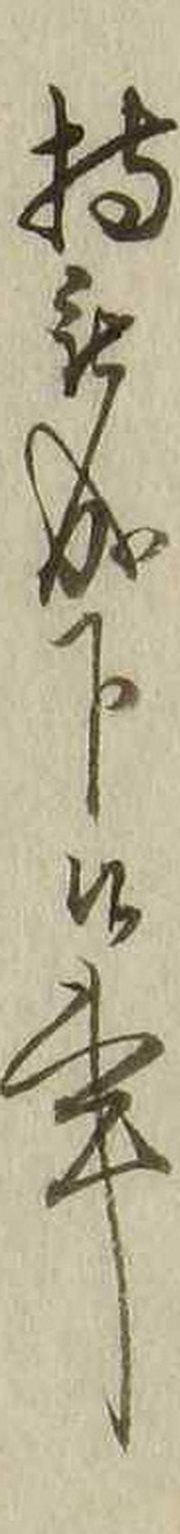持被成下候事
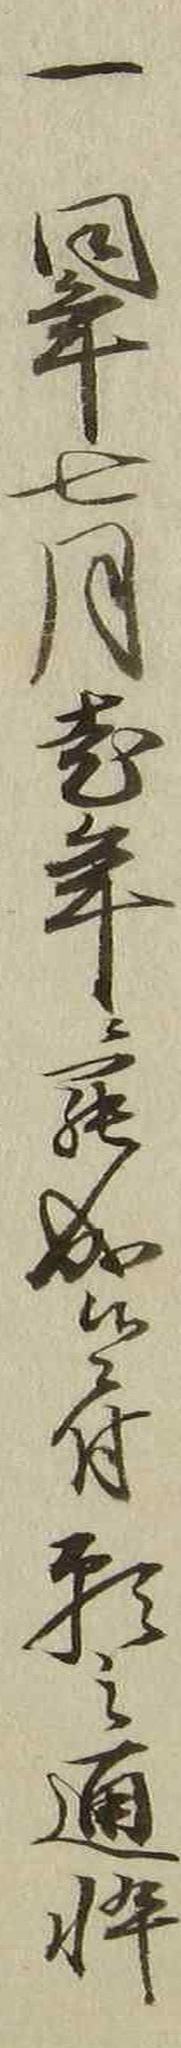一同年七月老年二罷成候ニ付願之通忰
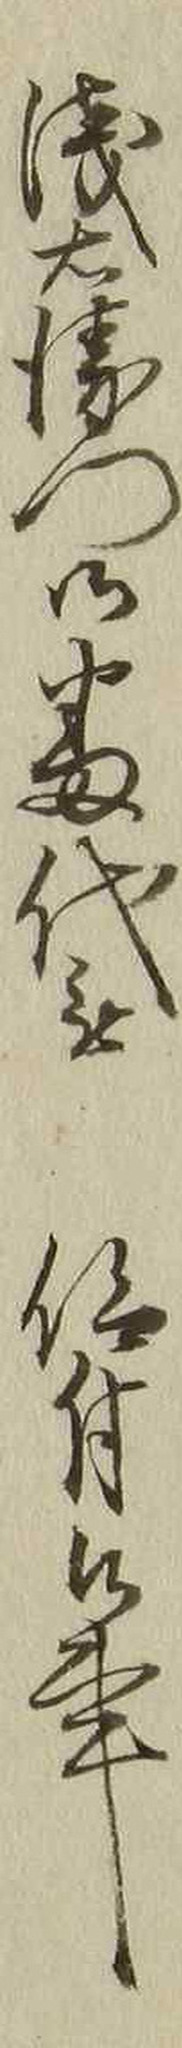浅右衛門御番代被仰付候事
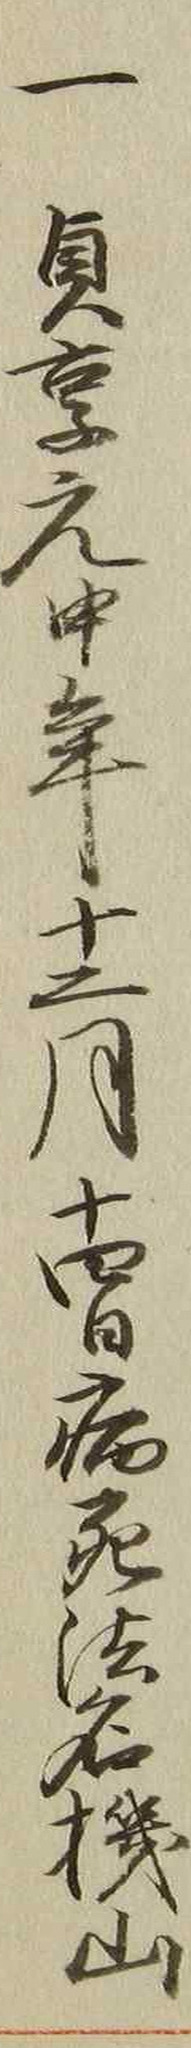一貞享元申年十二月十四日病死法名機山
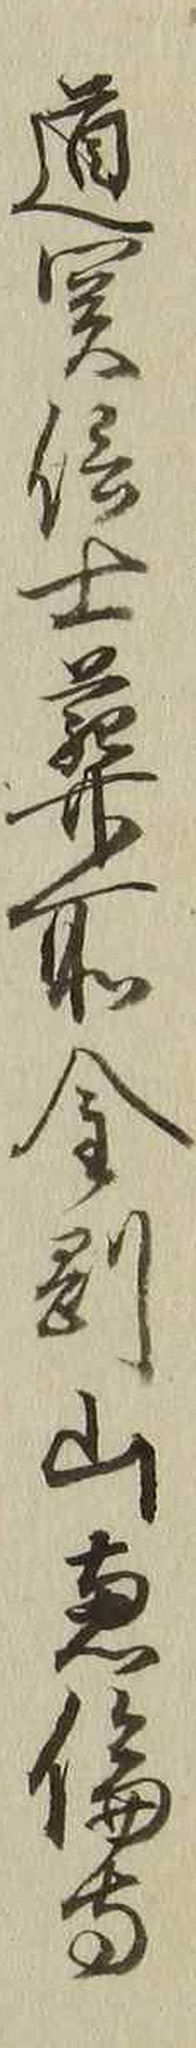道関信士葬所金剛山恵倫寺
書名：諸士系譜　巻之114　か之部22
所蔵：会津若松市立会津図書館
